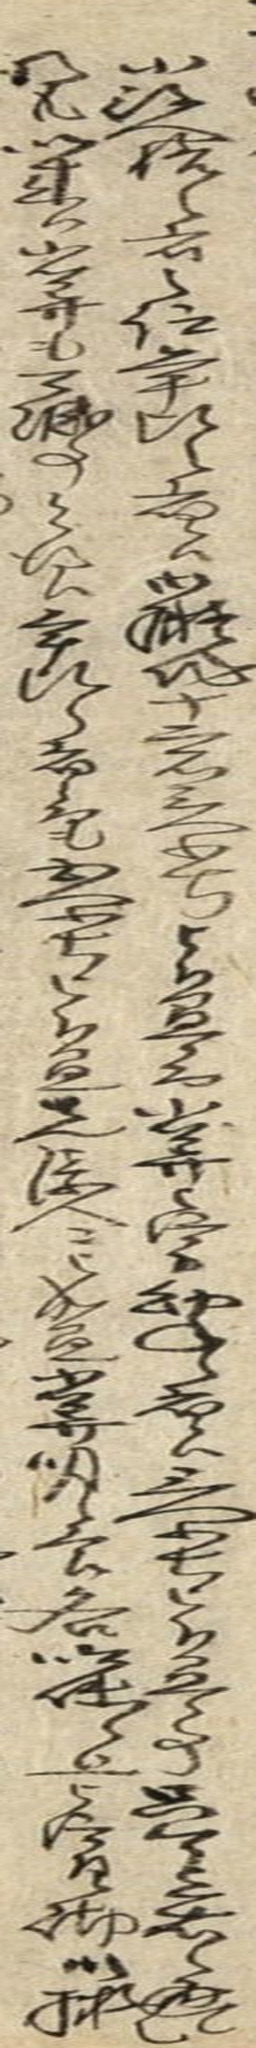得共以来は小算も可減候事に候得は年頃之者に而も五人ふち被下置先添人に被成置小算明候節各吟味之上被仰付候砌御擬
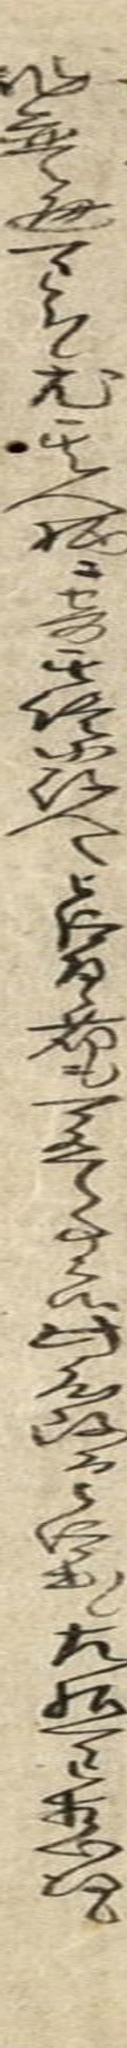作並之通可被下候尤其人柄に寄其侭小役人へ被仰付候者も可有之候事に候此度改而被仰出候左様可被相心得候
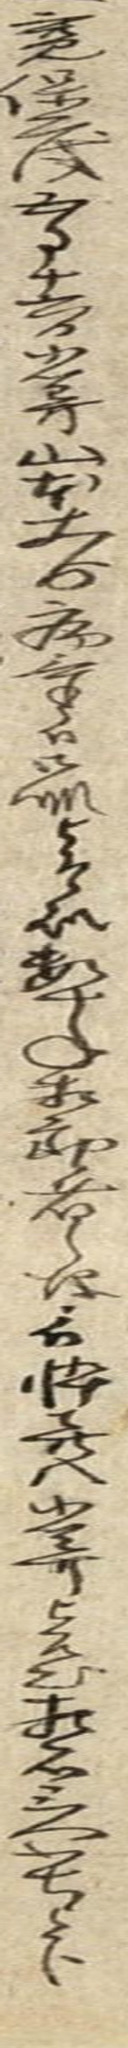一寛保二戌五月十六日小算山本丈右衛門病気に付御暇被下候処数十年相勤候者之儀に付忰喜八小算被召出拾石三人ふち被下
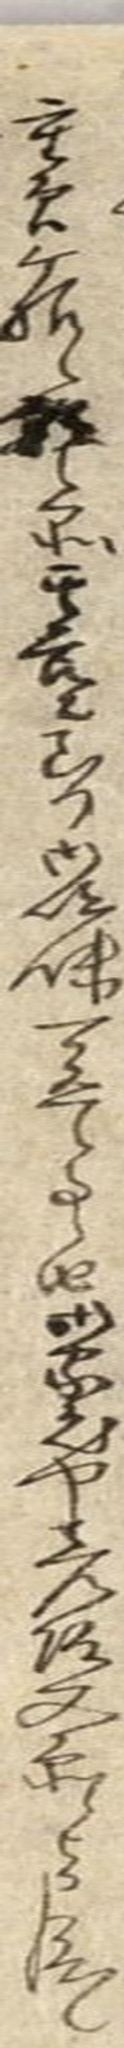重候而はケ様之願之品其節に至り御吟味可有之候事之由御家老中彦坂又兵衛へ被申渡候
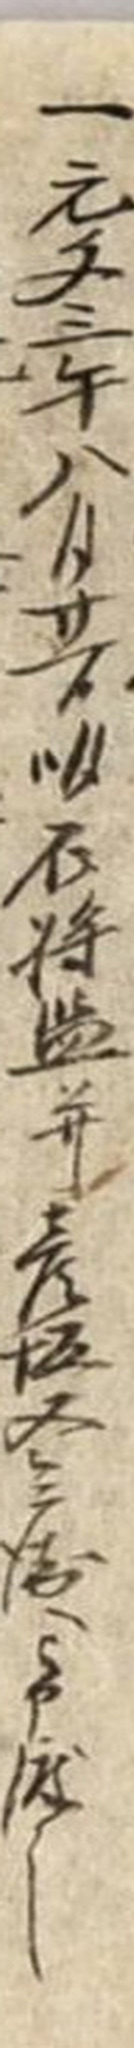一元文三午八月廿一日明石将監并彦坂又兵衛へ被申渡之
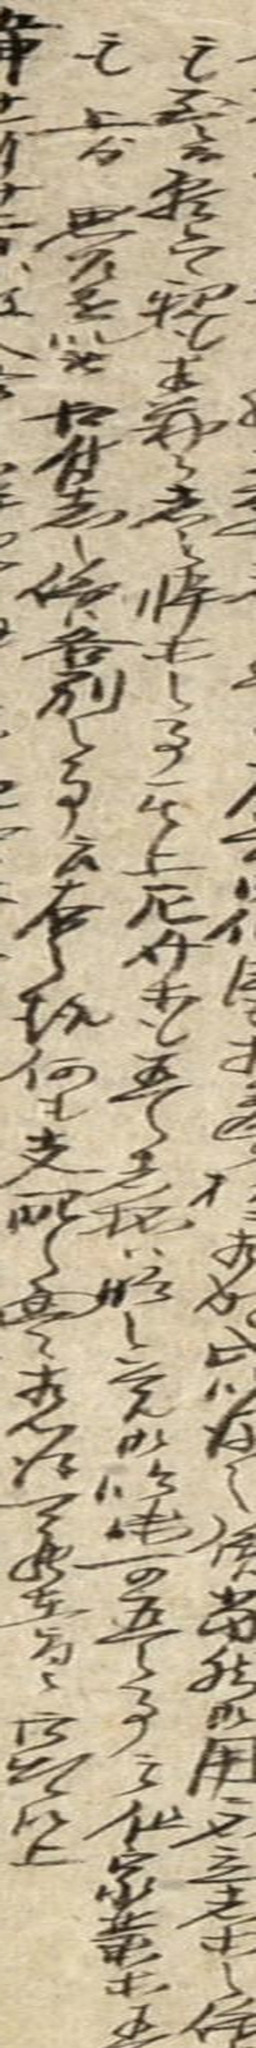にも上ゟ思召を以被仰付者之儀は各別之事に候右之趣何も支配之面々相心得可罷在旨被仰出候以上
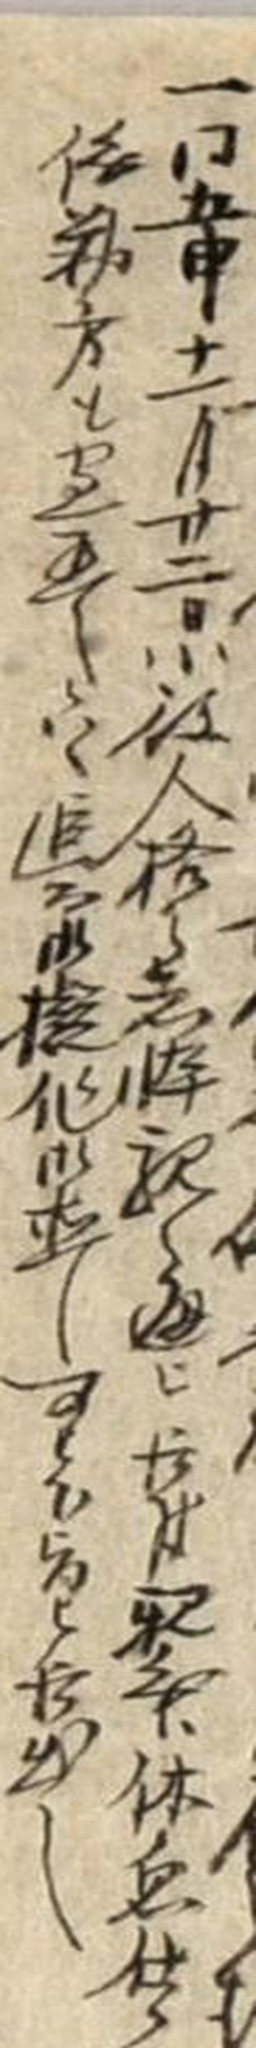儀勤方も宜有之候はゝ追而御擬作御直し可被下旨被仰出之

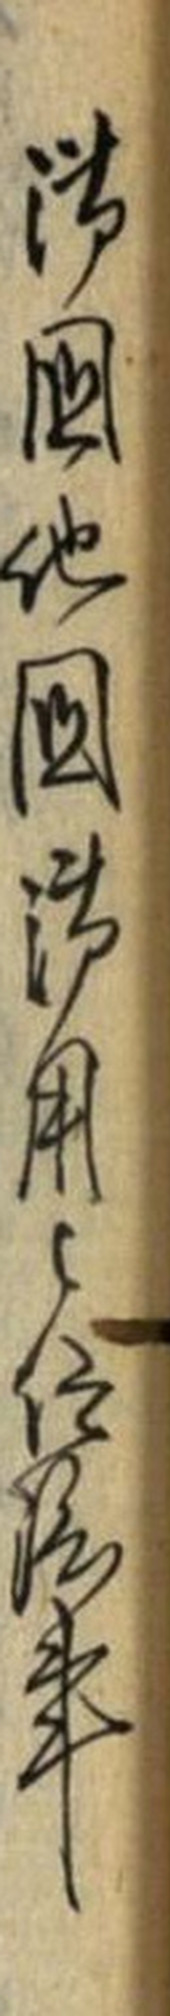御国他国御用被仰渡事
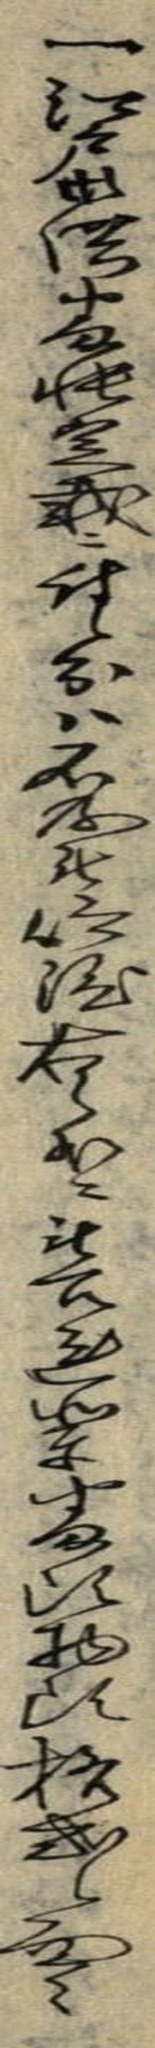一江戸御供番帳定載に付候分は不及被仰渡右之外に被召連輩番頭物頭格式之面々
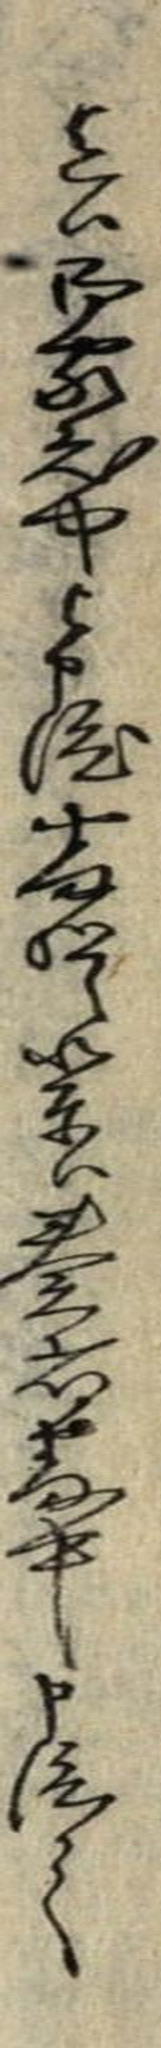迄は御家老中被申渡番組之輩は奏者番中申渡之
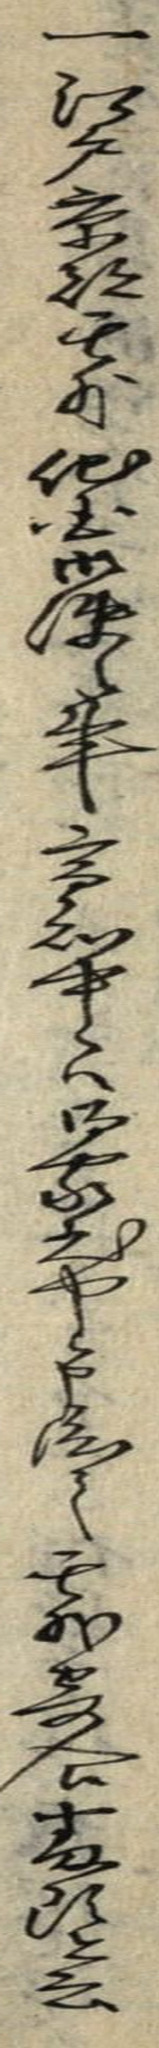一江戸京都其外他国御使之事高知中へは御家老中被申渡之其外寄合寄合番頭と云
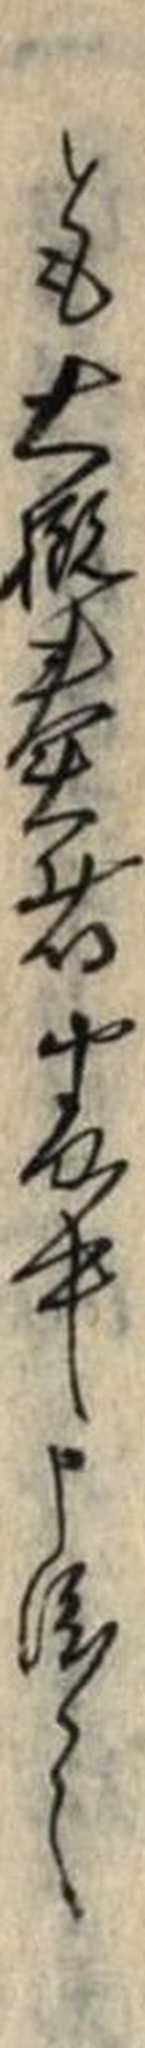とも大概奏者番中申渡之
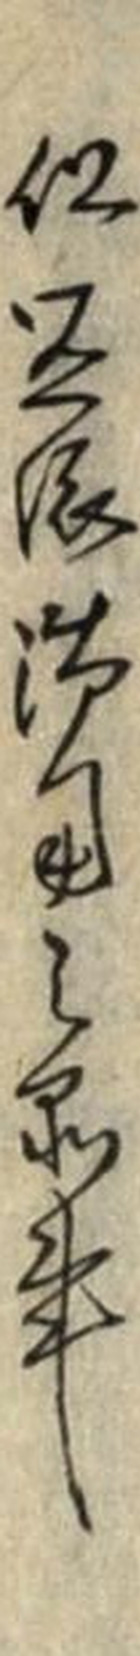但宜依御用之品事
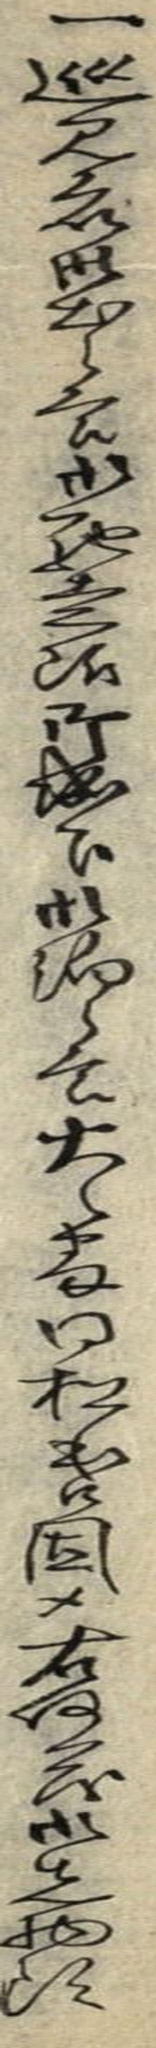一巡見衆御出之節御馳走附御城下御泊之節火之番同松本口固メ右何も御先物頭
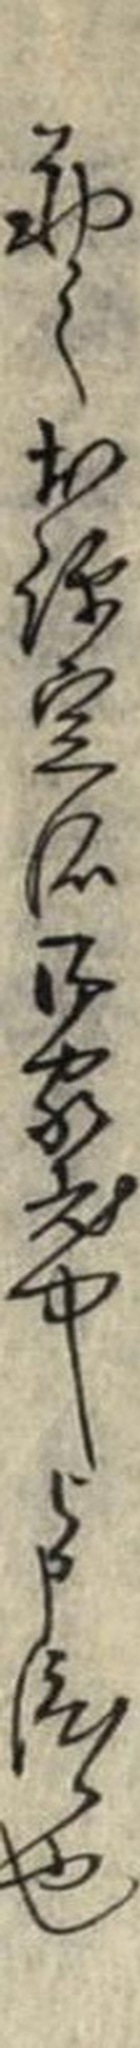勤之於勘定所御家老中被申渡候也
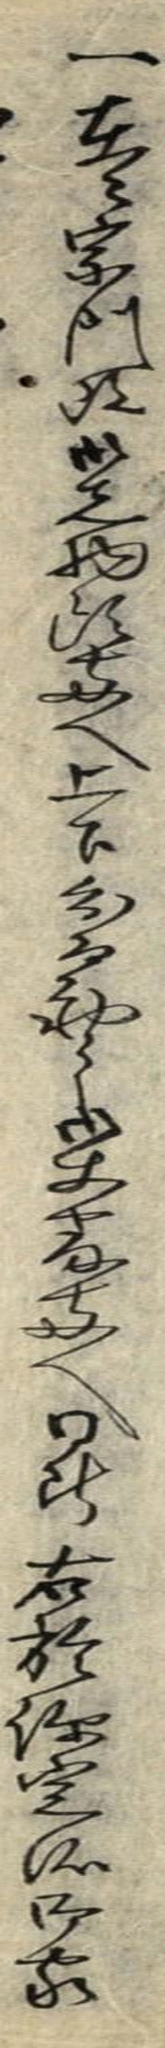一在々宗門改御先物頭両人上下分而勤之御使番両人同断右於評定所御家
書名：御用并被仰出之部
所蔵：福井県文書館 Fukui Prefectural Archives
